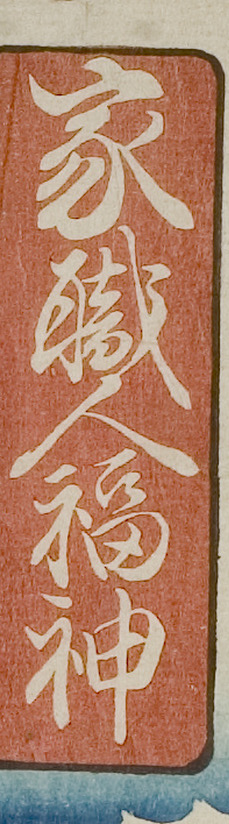家職人福神
